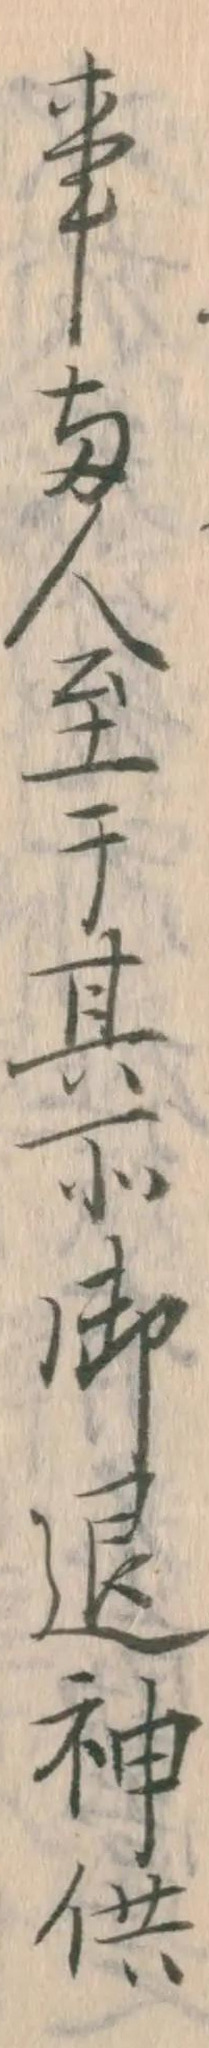事両人至于其所御退神供
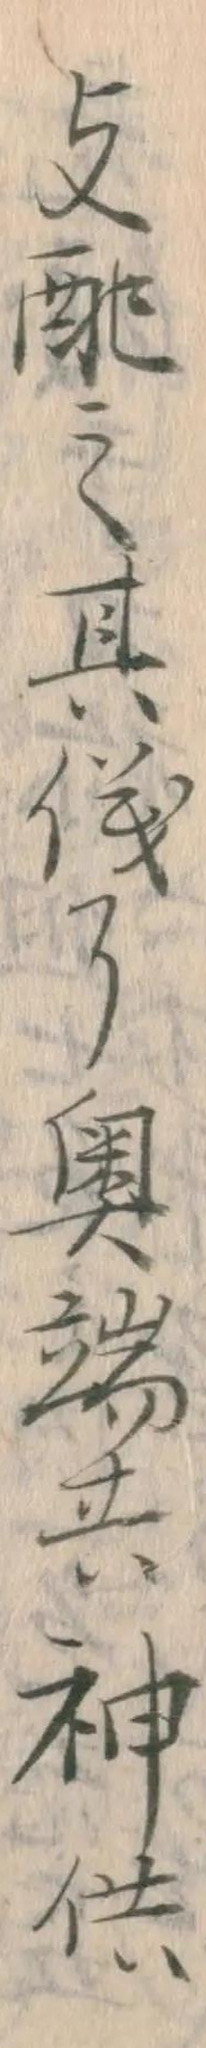支配之其儀了奥端共神供
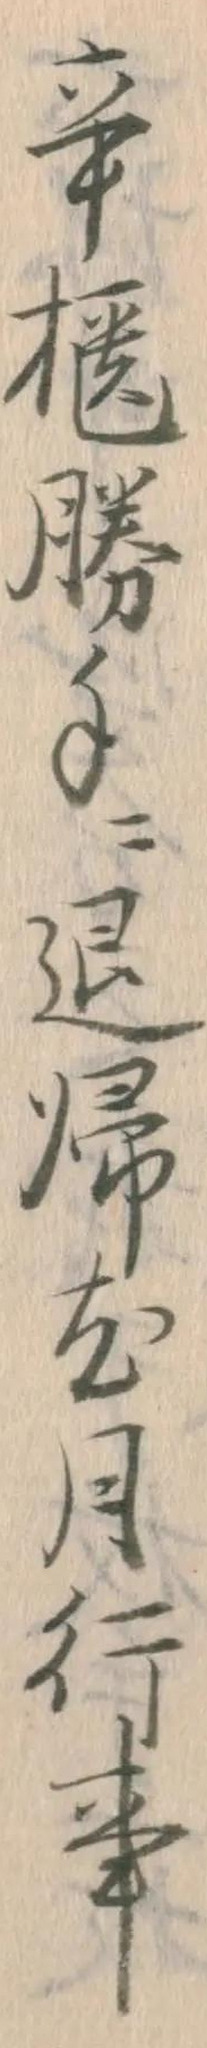辛櫃勝手に退帰尤月行事
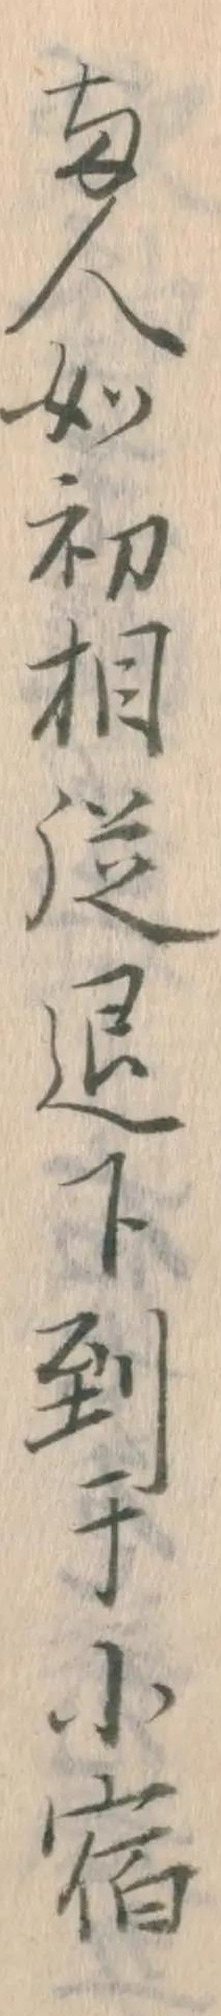両人如初相従退下到于小宿
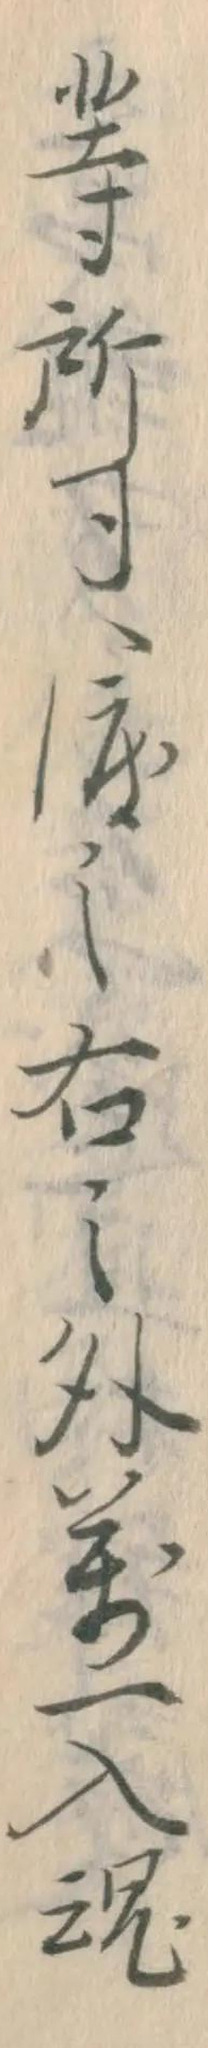等所司へ渡之右之外万一入魂

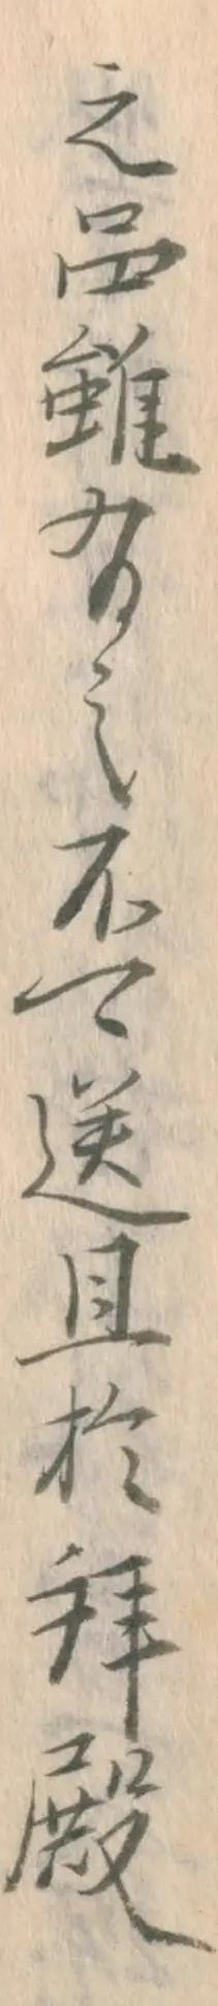之品雖有之不可送且於拝殿
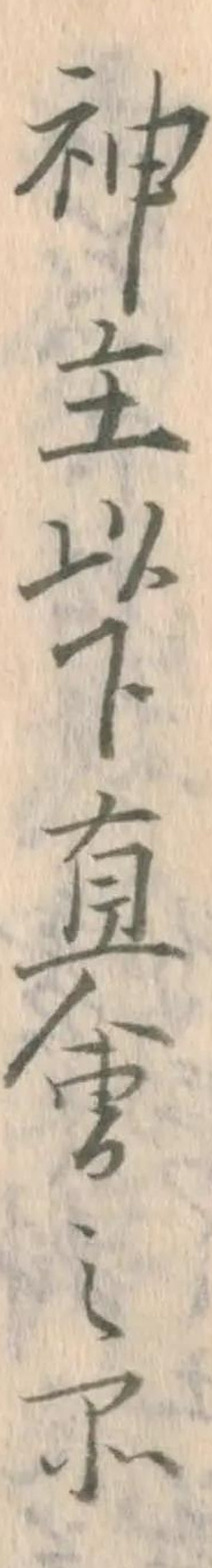神主以下直会之品
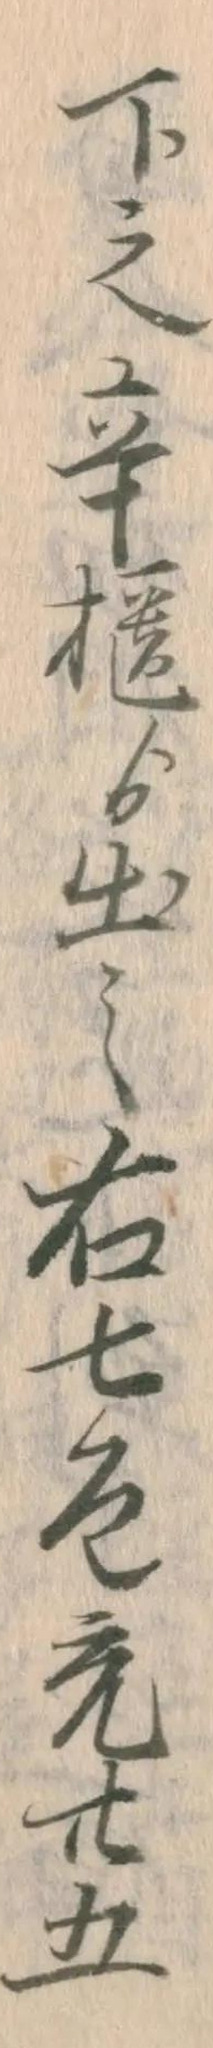下之辛櫃ゟ出之右七色充廿五
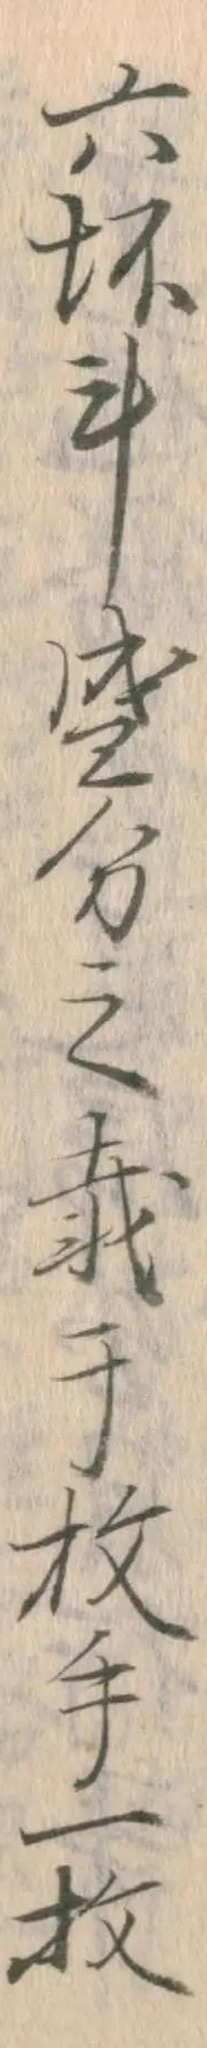六坏計盛分之載于枚手一枚
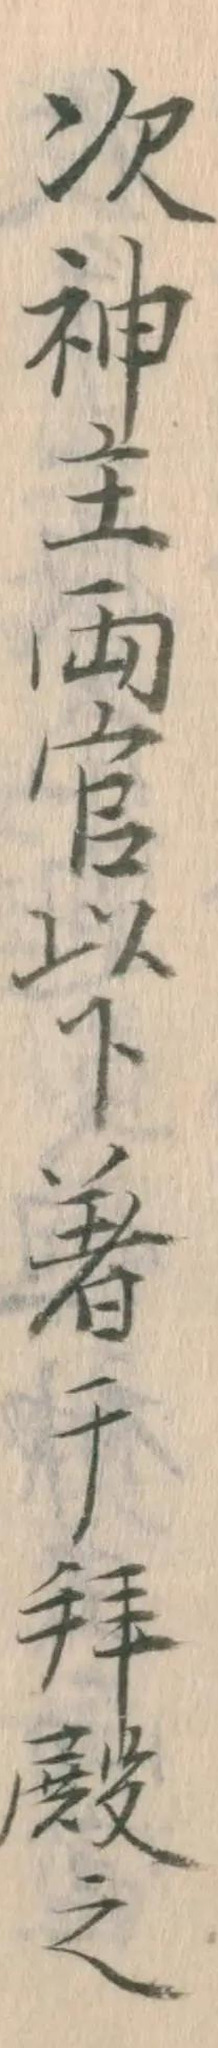次神主両官以下着于拝殿之
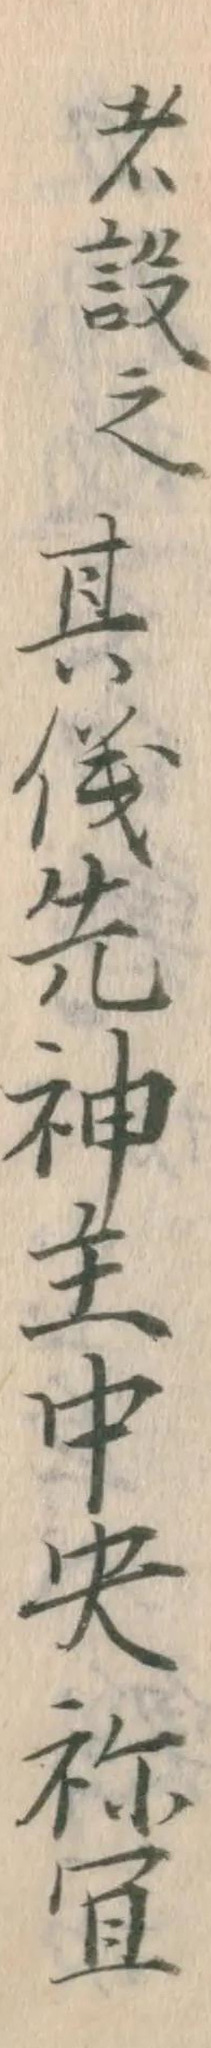者設之其儀先神主中央称宜
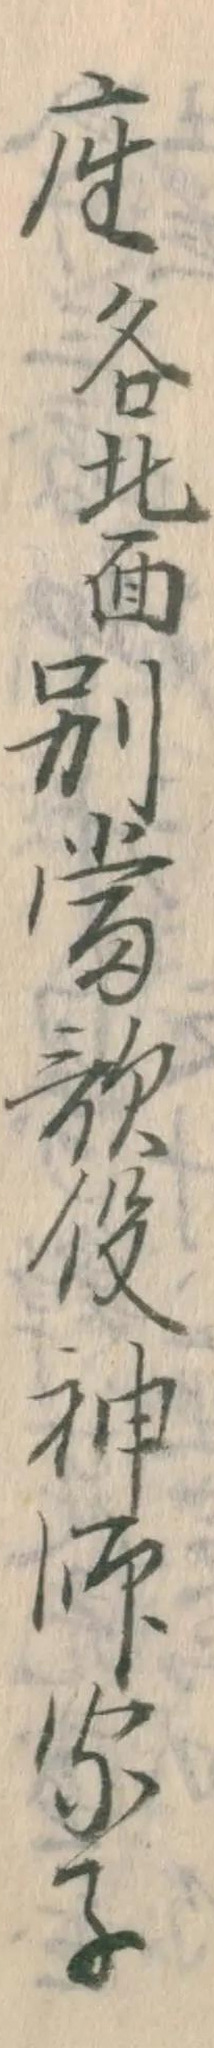座各北面別当歌役神師家子
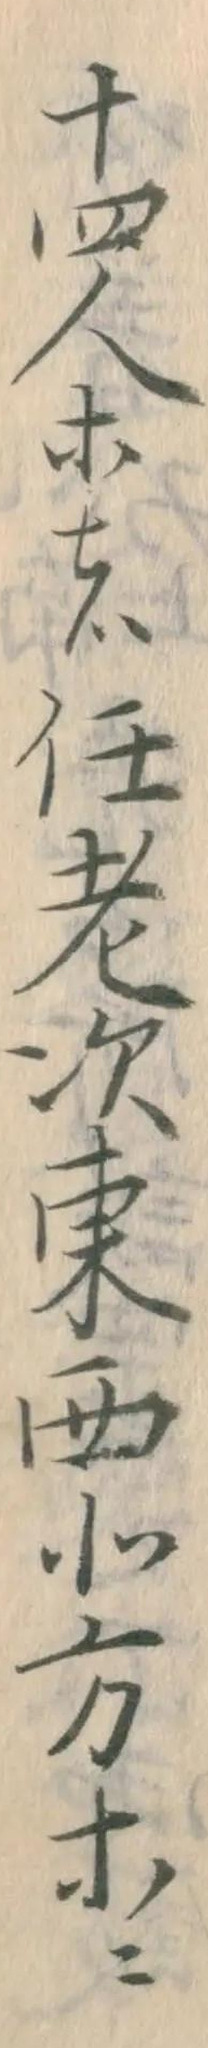十四人等者任老次東西北方等に

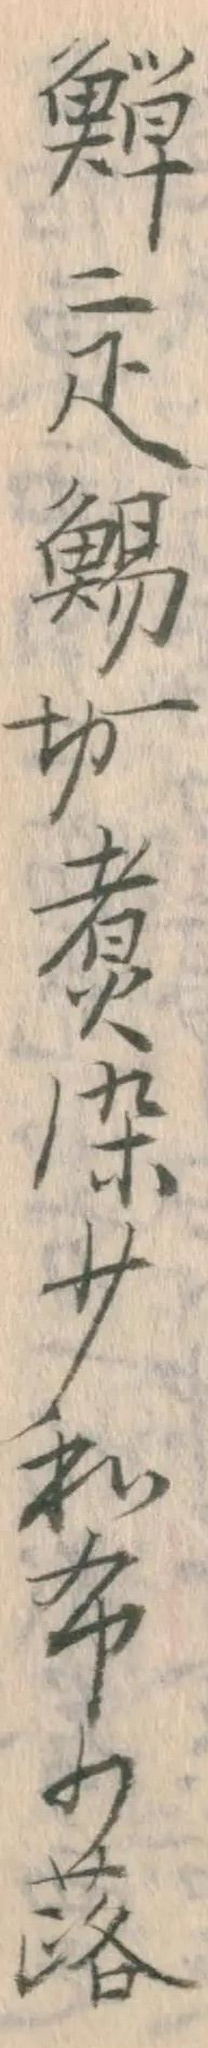鱓二疋鯣切煮染少和布少蕗
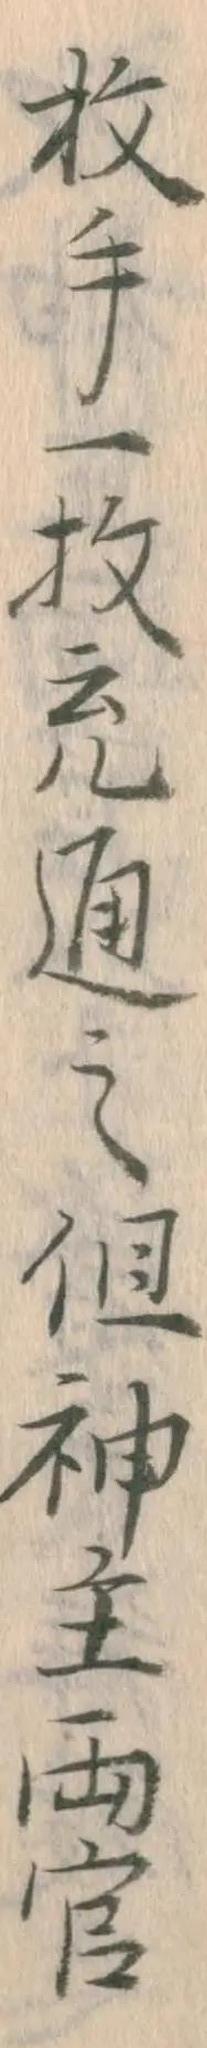枚手一枚充通之但神主両官
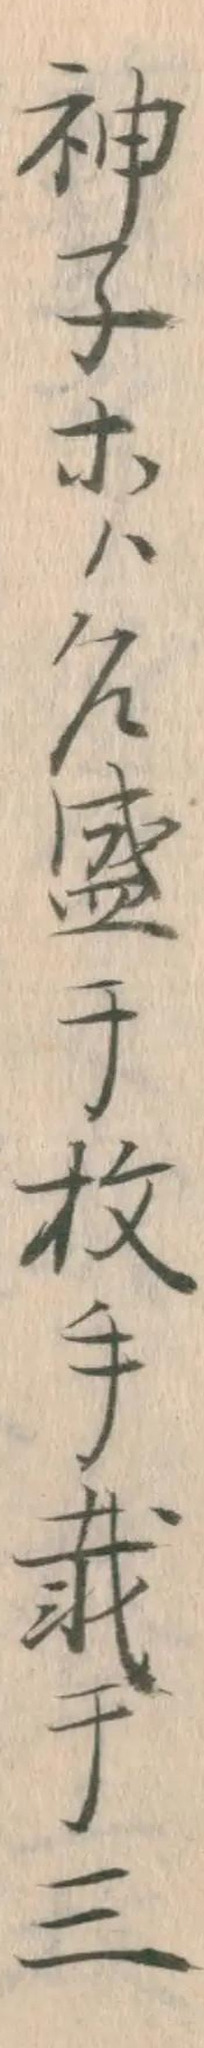神子等は乍盛于枚手載于三
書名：賀茂社記録. 第81冊
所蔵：国立国会図書館 National Diet Library, JAPAN
